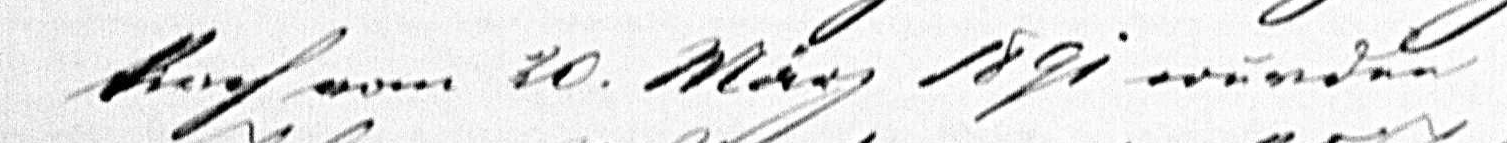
kirch vom 20. März 1891 wurden
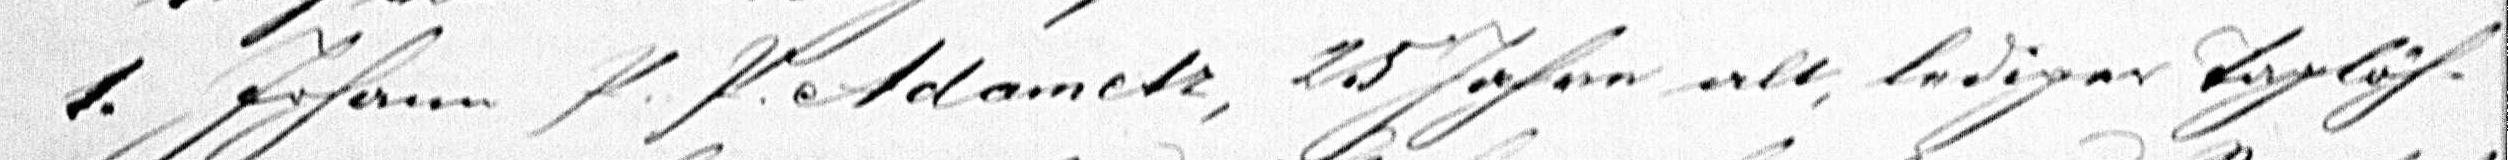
1. Johann P. P. Adametz, 25 Jahre alt, lediger Taglöh¬
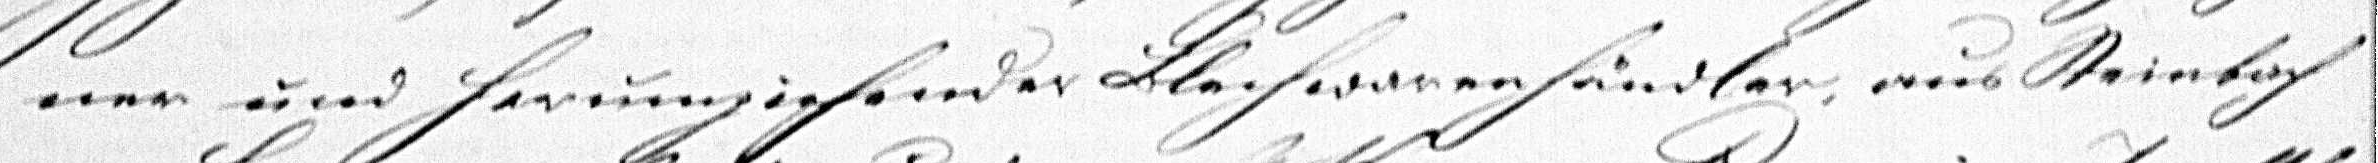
ner und herumziehender Blechwarenhändler, aus Steinbach
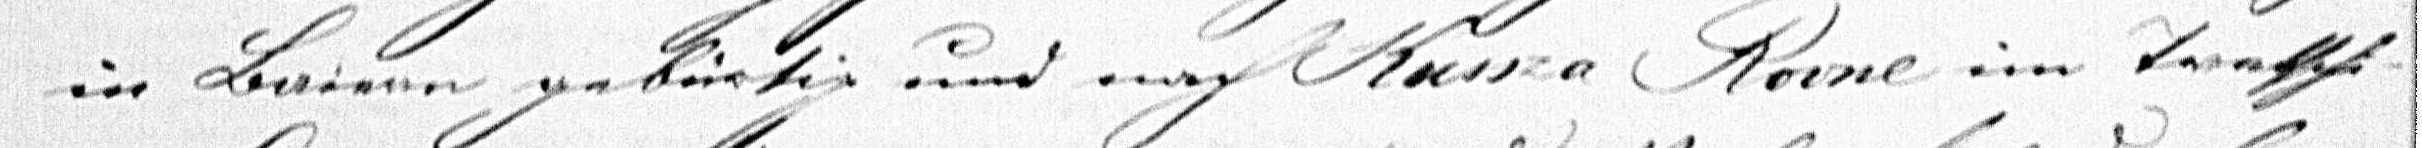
in Baiern gebürtig und nach Kunza Rovne im Tretschi¬
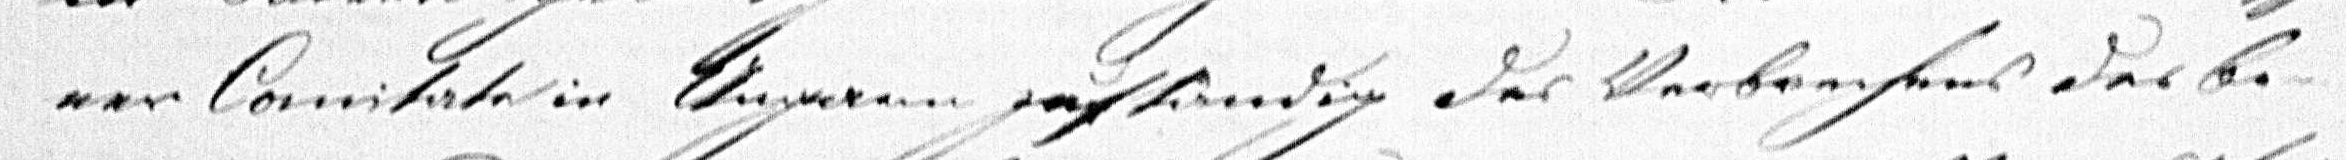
ner Comitate in Ungarn zuständig des Verbrechens des be¬
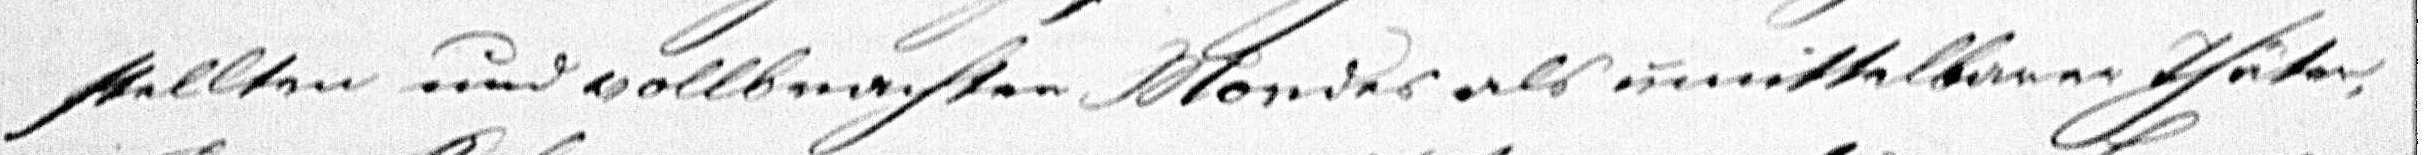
stellten und vollbrachten Mordes als unmittelbarer Thäter,
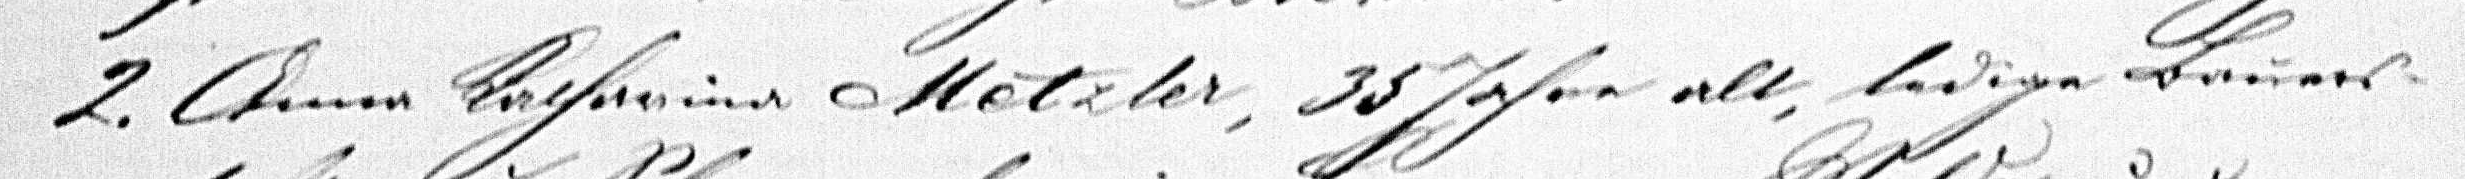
2. Anna Katharina Metzler, 35 Jahre alt, ledige Bauers¬
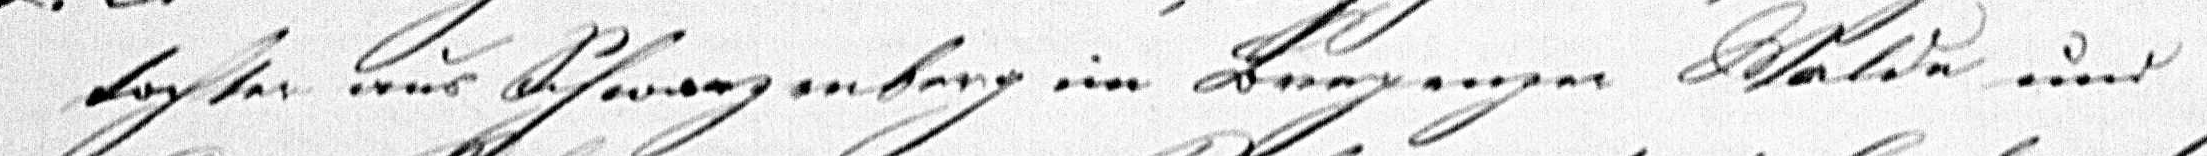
tochter aus Schwarzenberg im Bregenzer Walde und
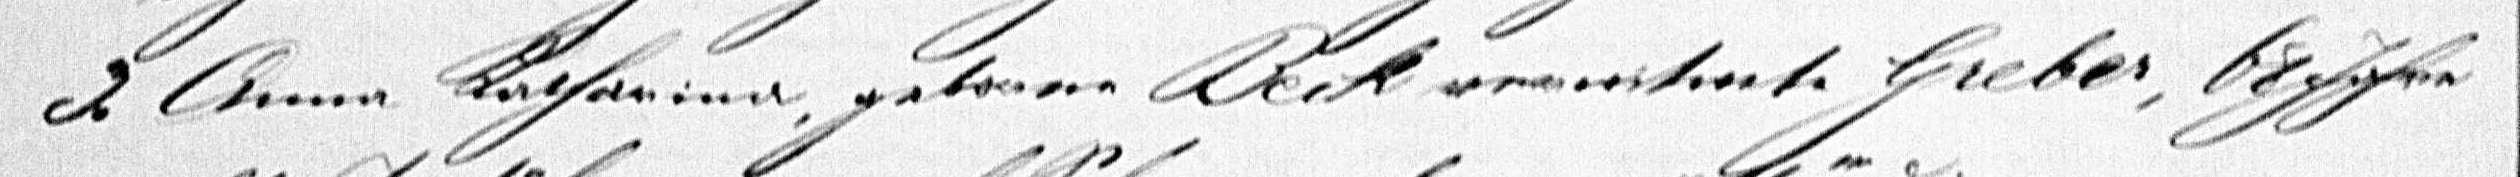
3. Anna Katharina, geboren Beik verwitwete Greber, 68 Jahre
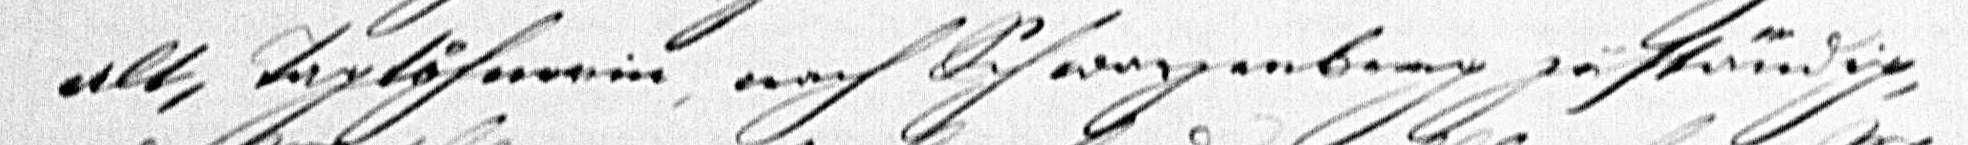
alt, Taglöhnerin, nach Schwarzenberg zuständig,
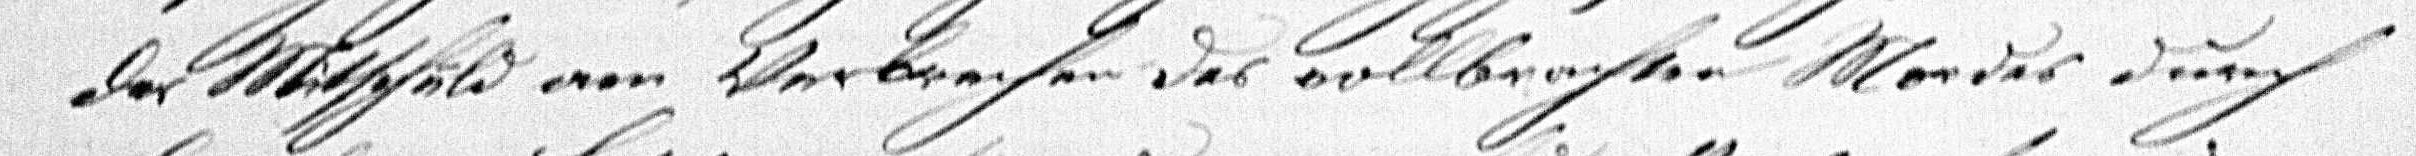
der Mitschuld am Verbrechen des vollbrachten Mordes durch
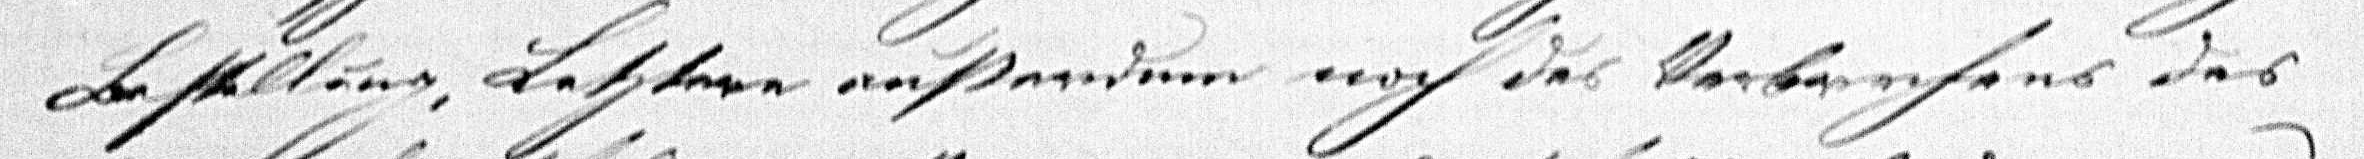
Bestellung, Letztere außerdem noch des Verbrechens des
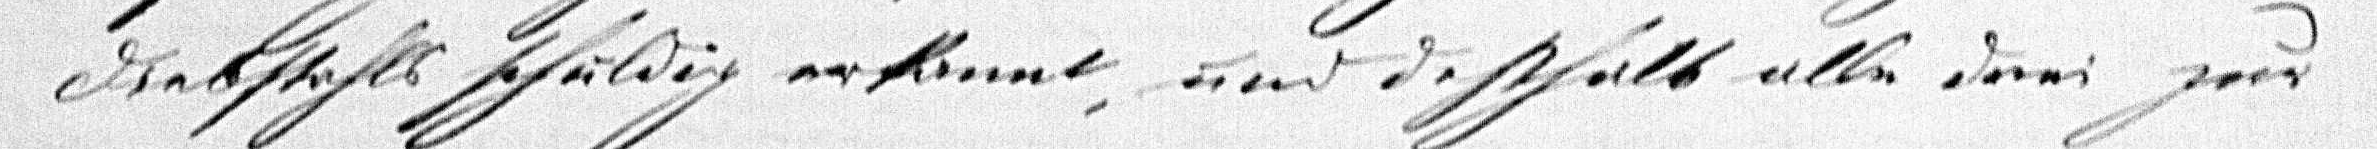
Diebstahls schuldig erkannt, und deshalb alle drei zur
